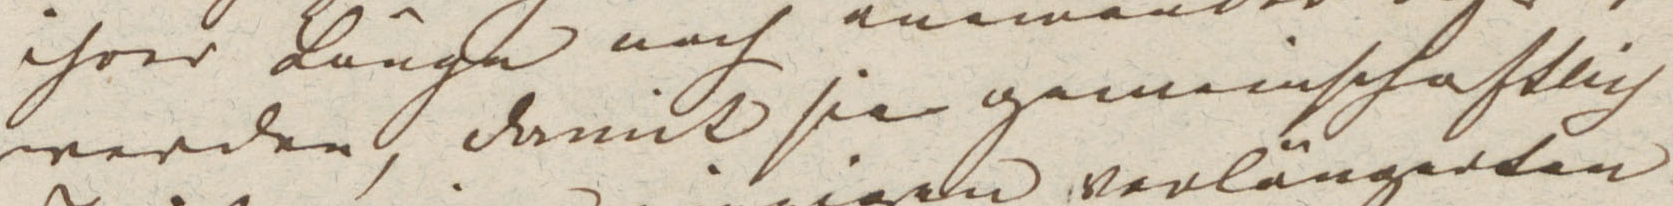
werden, damit sie gemeinschaftlich
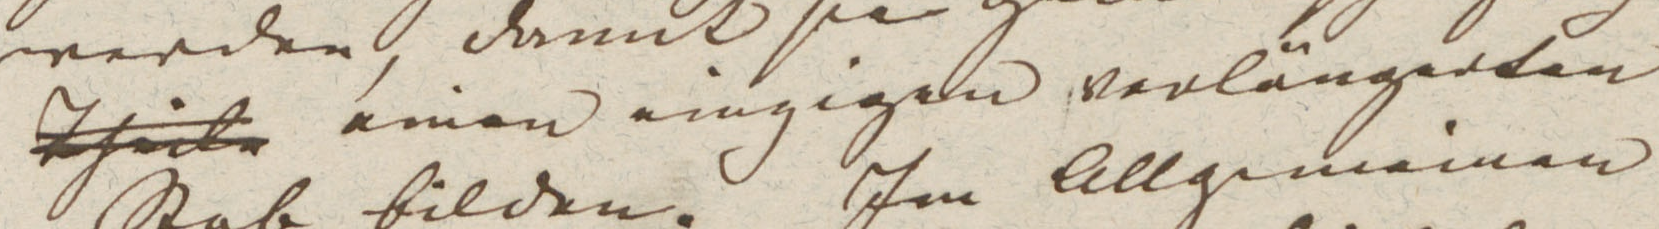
Theile einen einzigen verlängerten
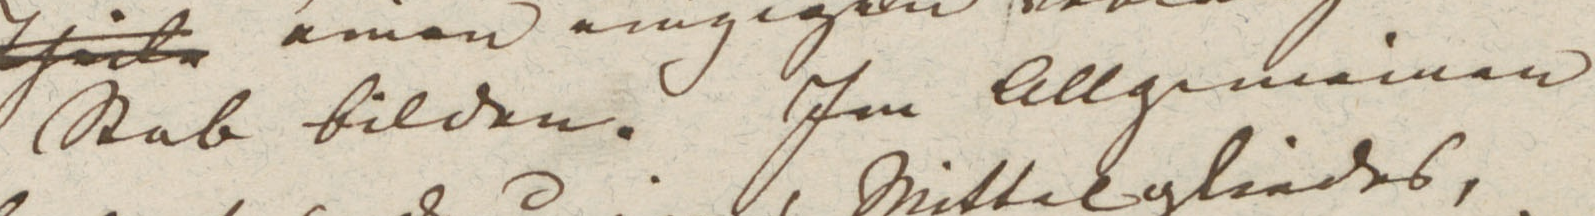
Stab bilden. Im Allgemeinen
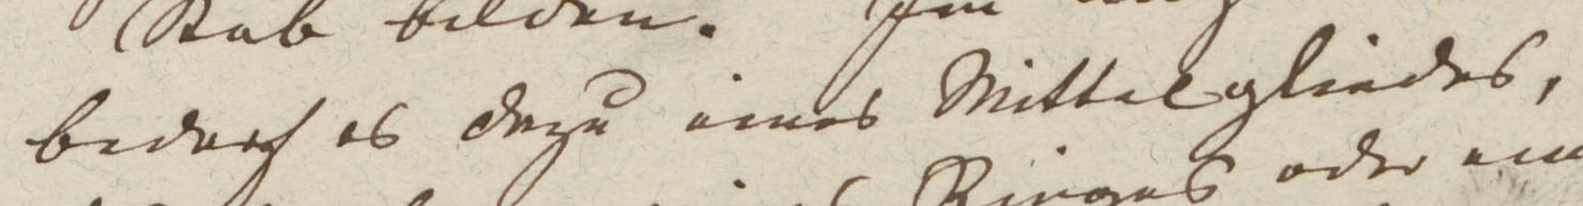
bedarf es dazu eines Mittelgliedes,
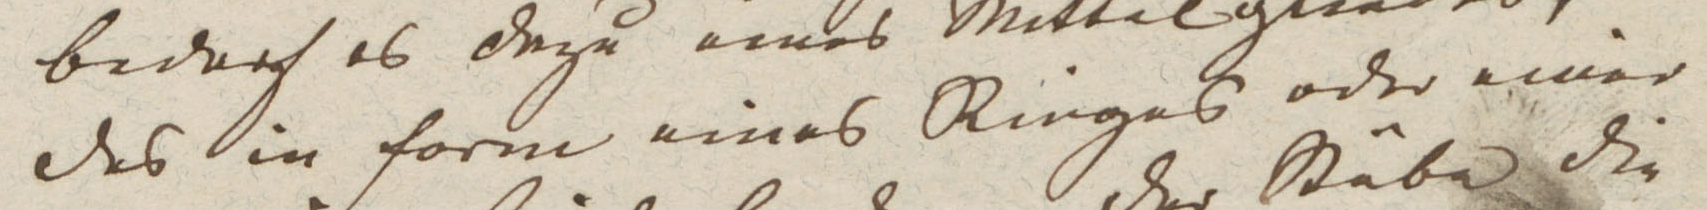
das in Form eines Ringes oder einer
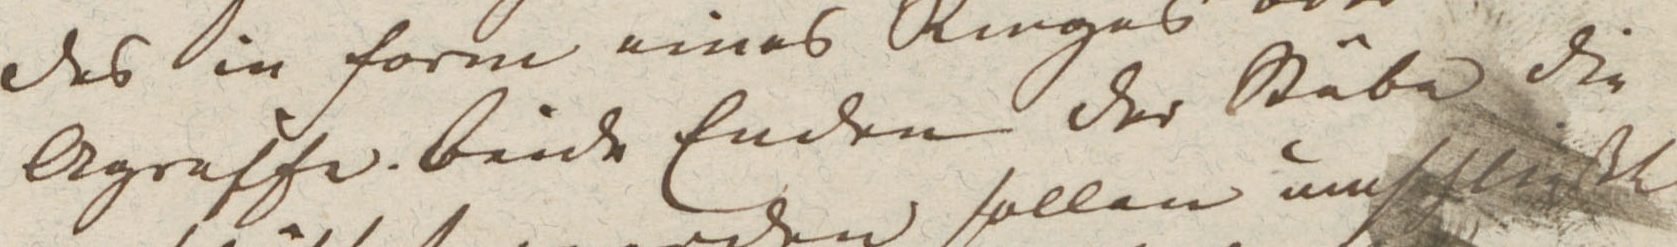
Agraffe. bBeide Enden der Stäbe die
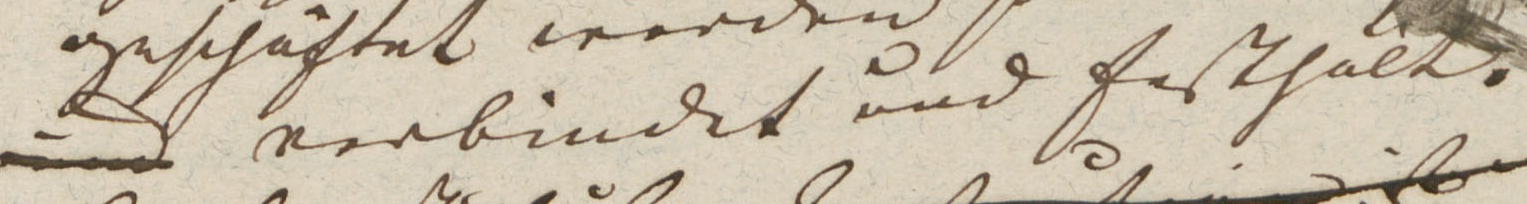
und verbindet und festhält.
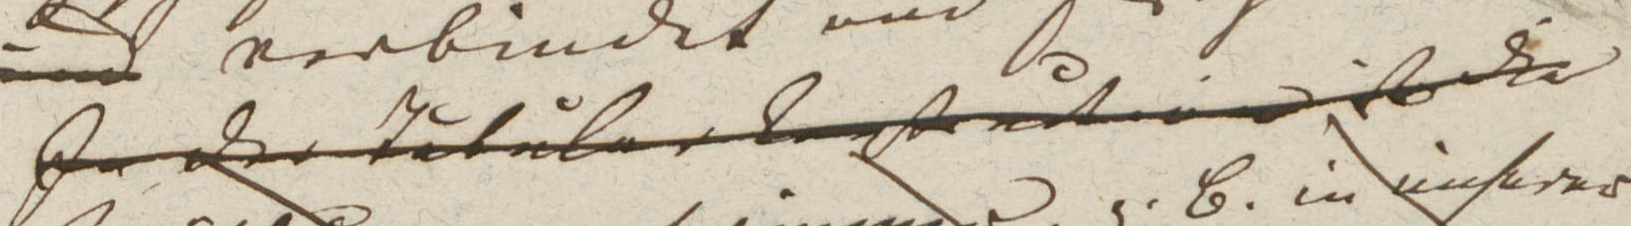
In der Tubularkonstruction ist die
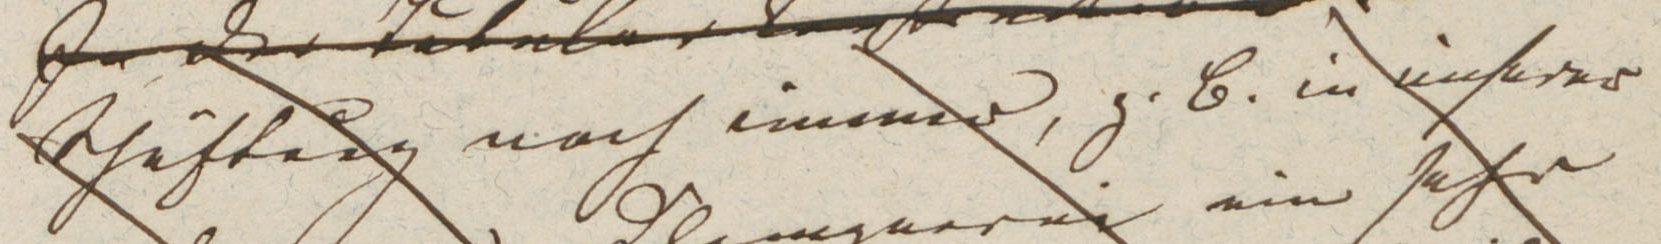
Schäftung noch immer, z. B. in unserer
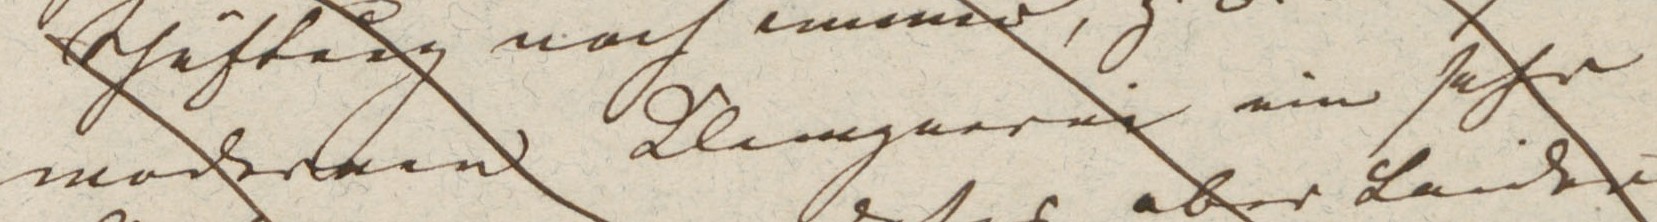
modernen Klempnerei ein sehr
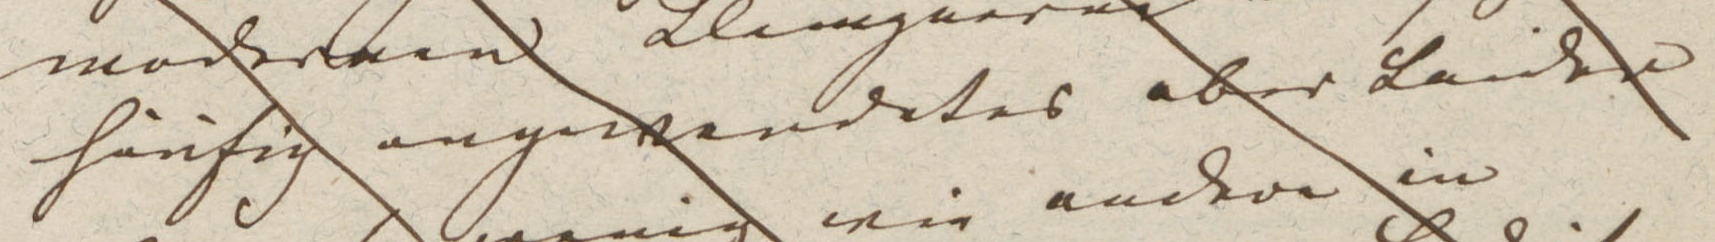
häufig angewendetes aber Leider
